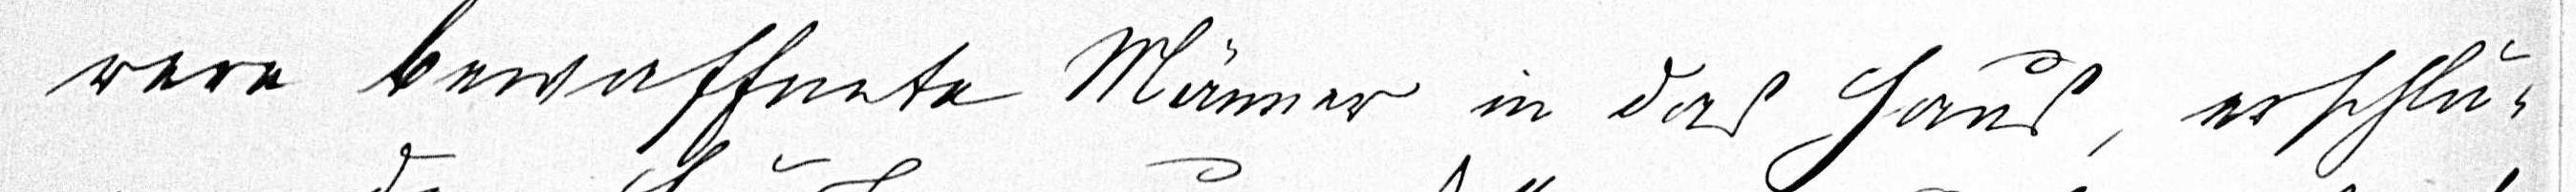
rere bewaffnete Männer in das Haus, erschlu¬
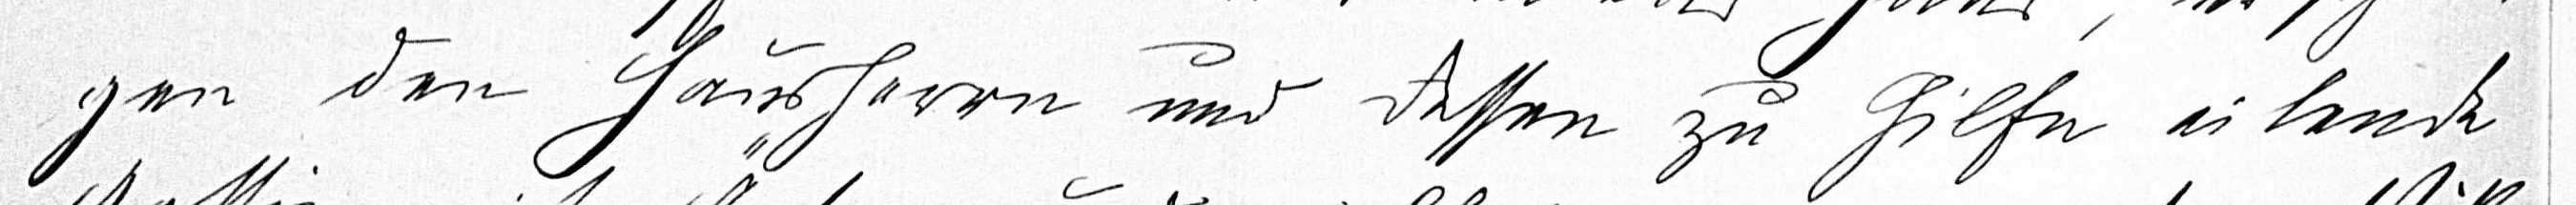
gen den Hausherrn und dessen zu Hilfe xx lende
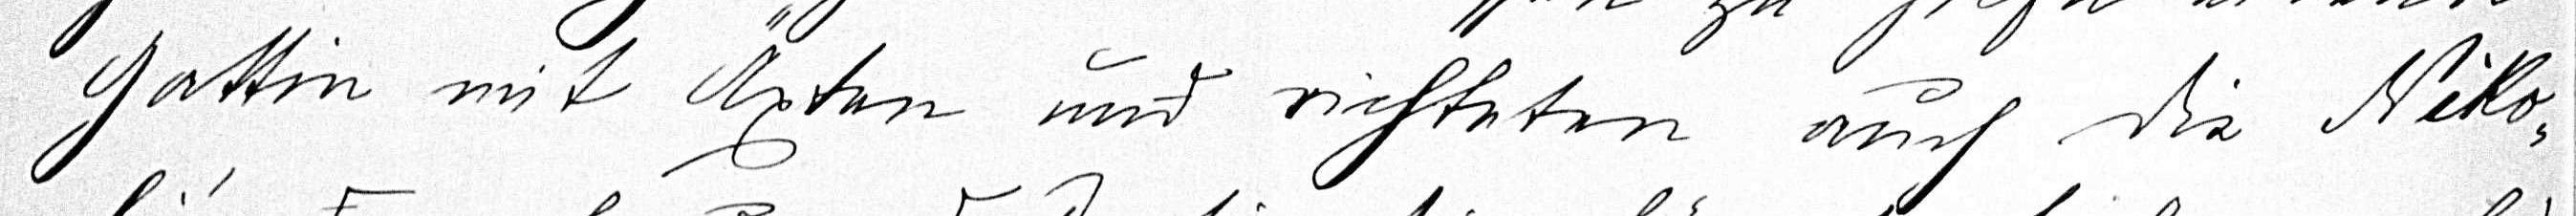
Gattin mit Äxten und richteten auch die Niko¬
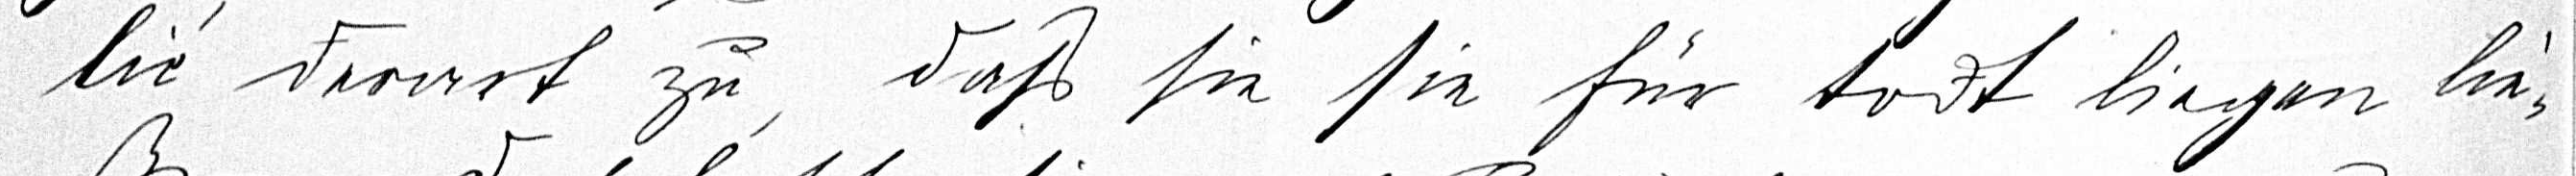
lić derart zu daß sie sie für todt liegen lie¬
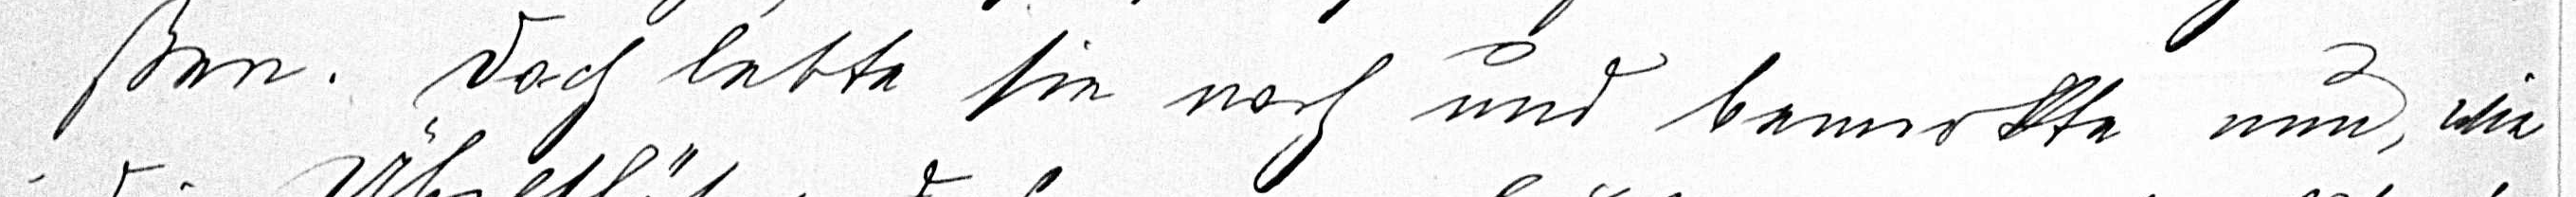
ßen. Doch lette sie noch und bemerkte nun, wie
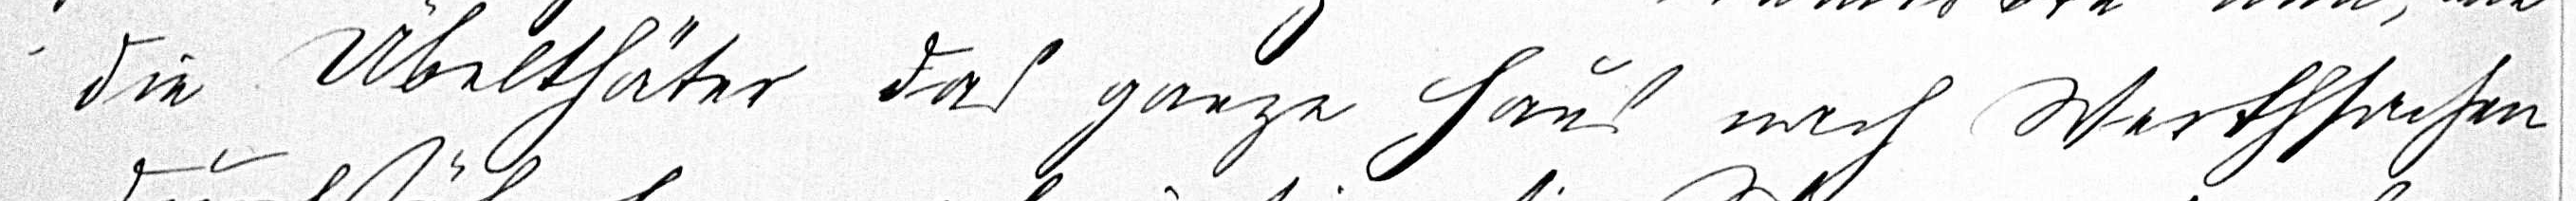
die Übelthäter das ganze Haus nach Werthsachen
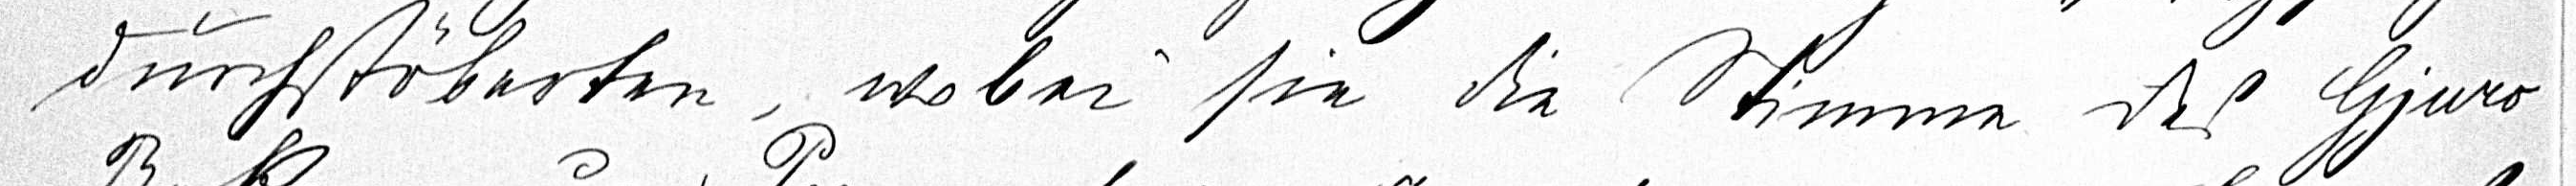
durchstöberten, wobei sie die Stimme des Gjuro
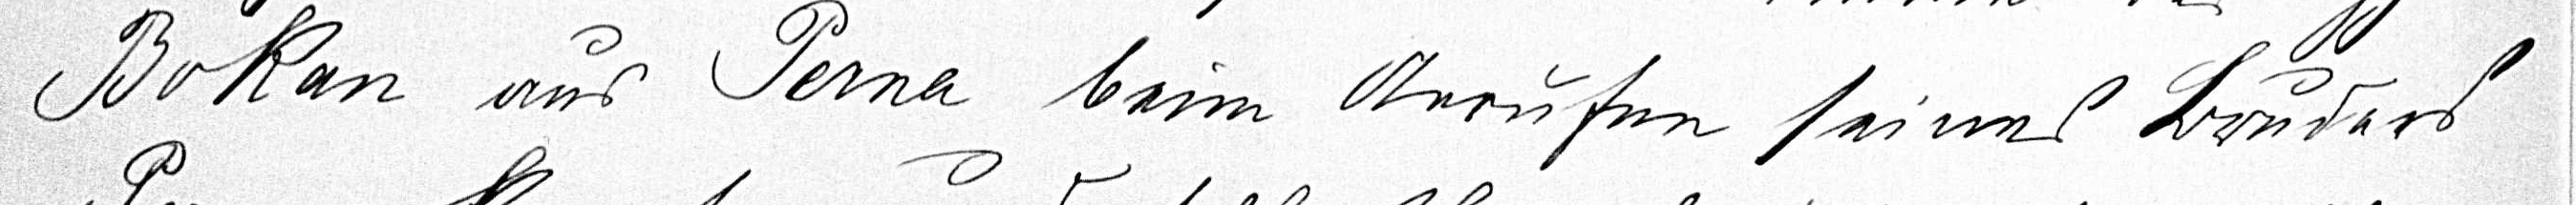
Bokan aus Perna beim Anrufen seines Bruders
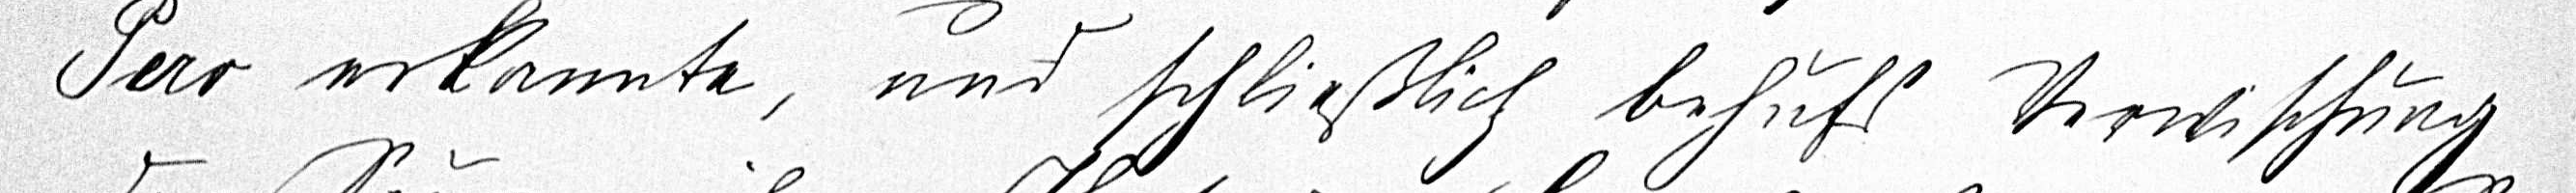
Pero erkannte, und schließlich behufs Verwischung
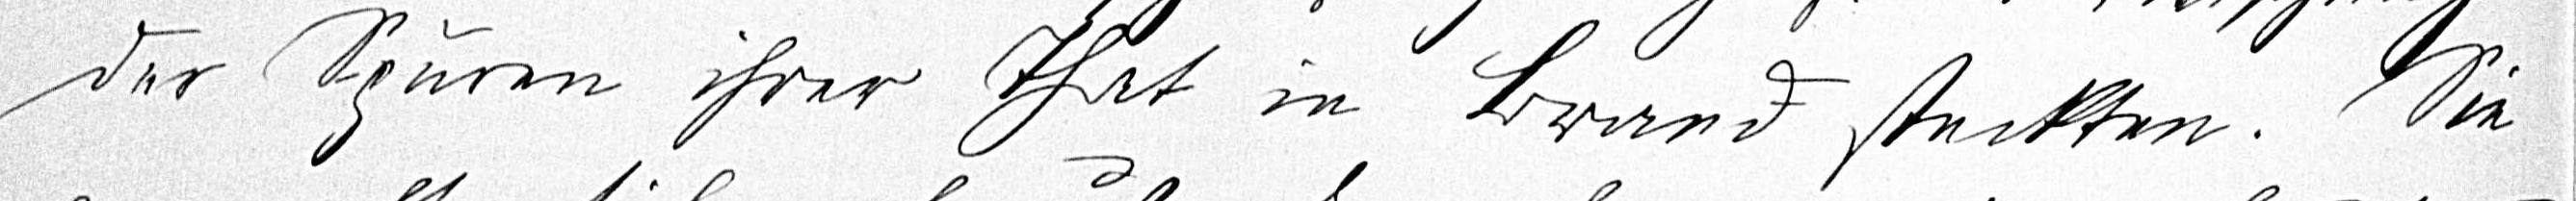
der Spuren ihrer That in Brand steckten. Sie
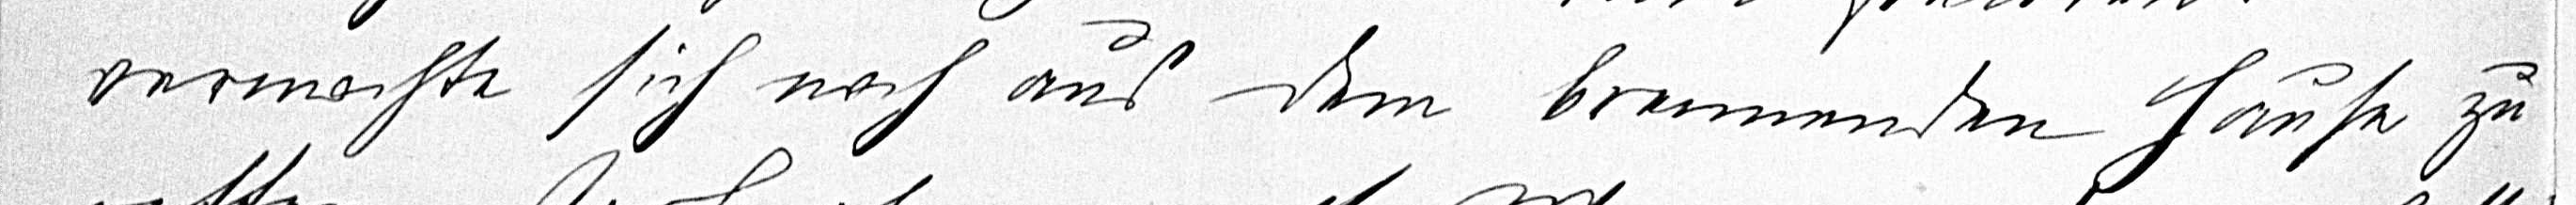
vermachte sich nach aus dem brennenden Hause zu
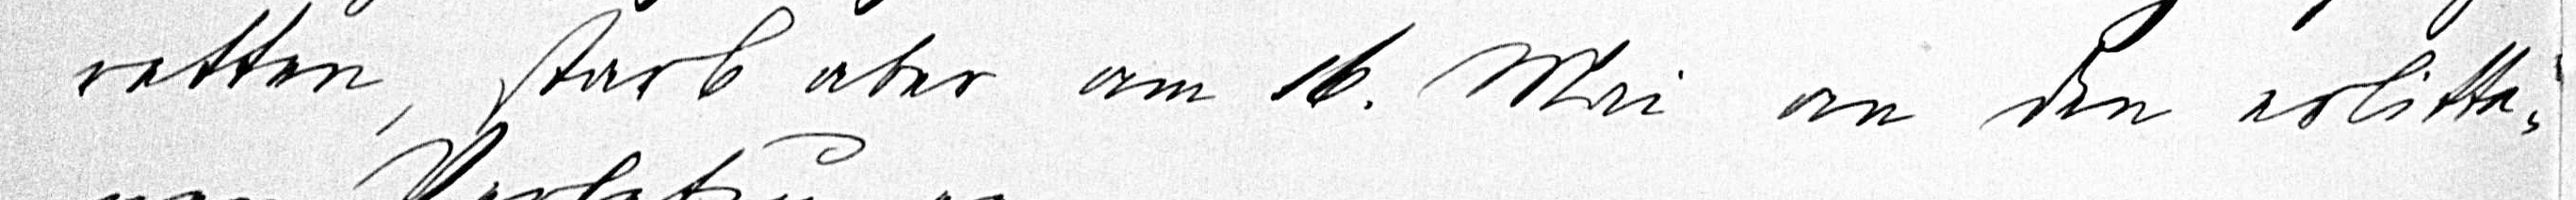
retten, starb aber am 16. Mai an den erlitte¬
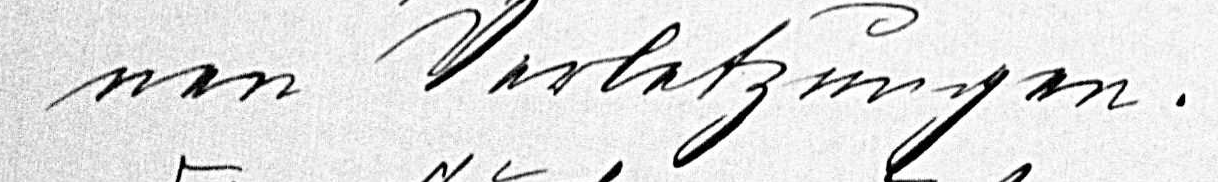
nen Verletzungen.
